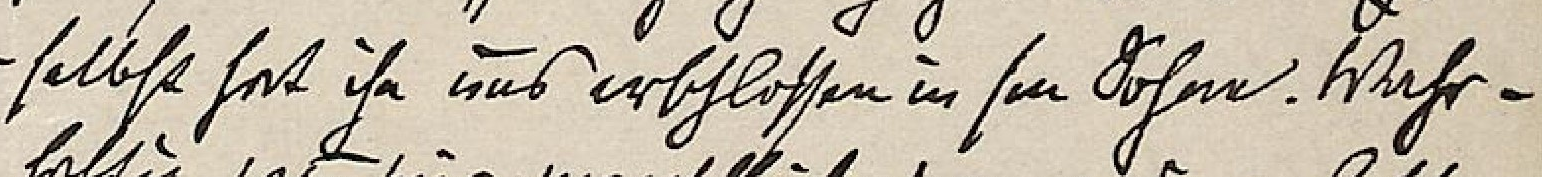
selbst hat ihn uns erschlossen in sm Sohn. Wahr¬
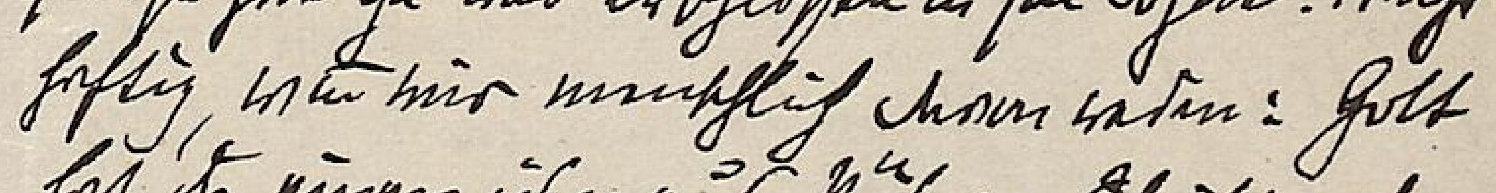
haftig, wie wir menschlich davon reden: Gott
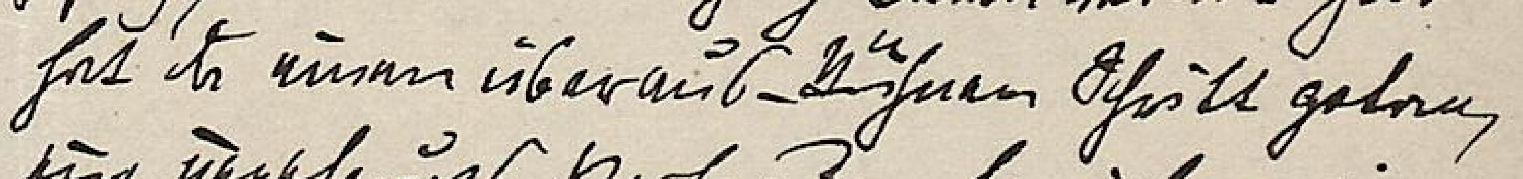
hat da einen überaus_kühnen Schritt getan,
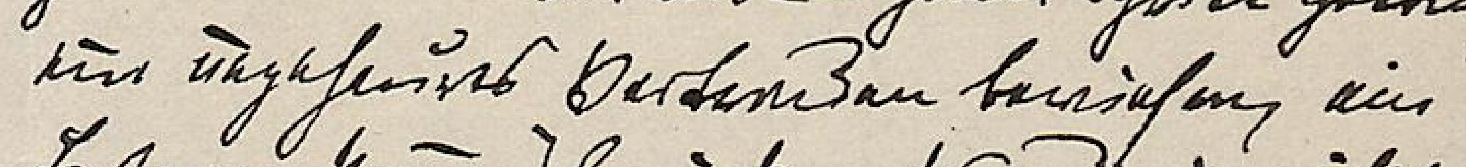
ein ungeheures Vertrauen bewiesen, ein
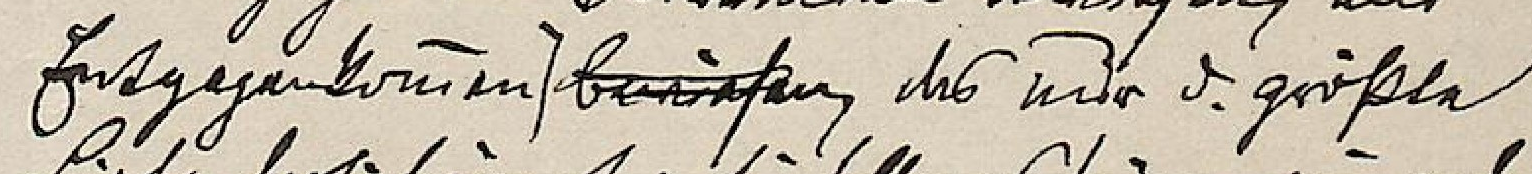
Entgegenkomen ], das nur d. größte
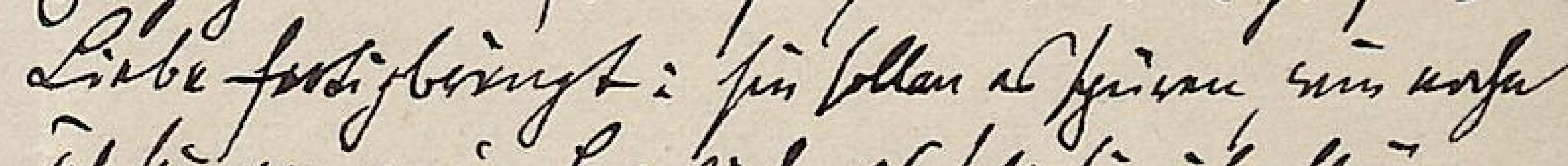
Liebe fertigbringt: sie sollen es spüren, wie nahe
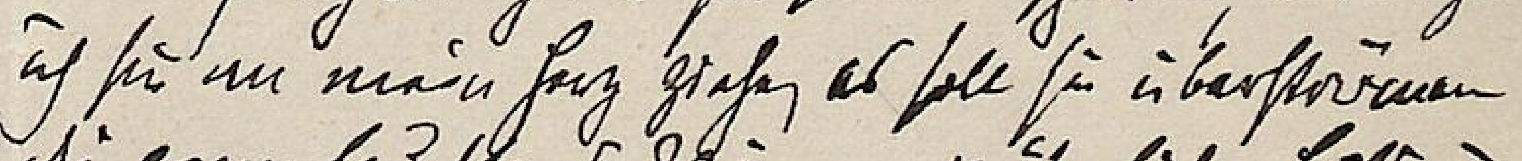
ich sie an man Herz ziehe, es soll sie überströmen
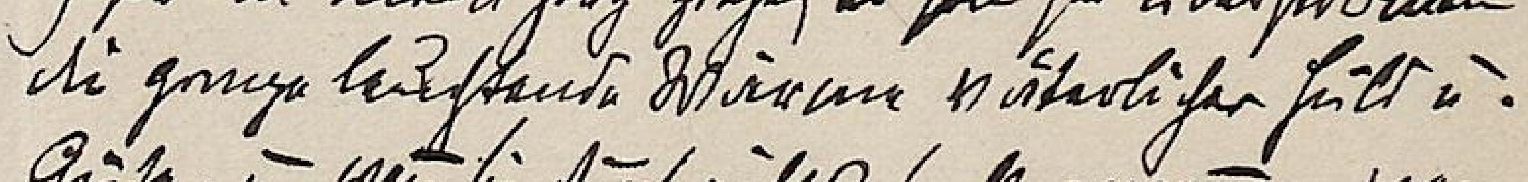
die ganze leuchtende Wärme väterlicher Huld u.
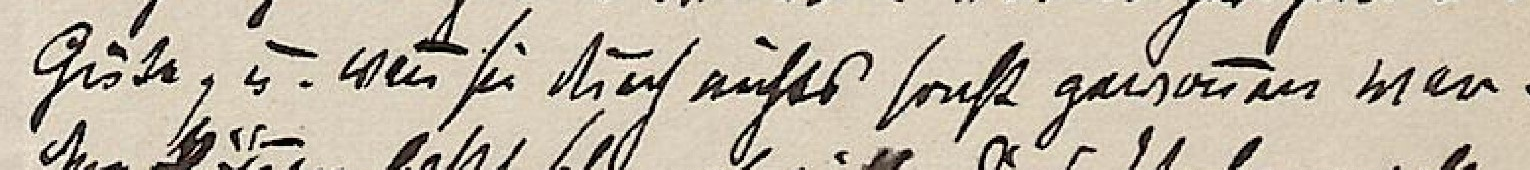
Güte: u. wen sie durch nichts sonst gewonnen wer¬
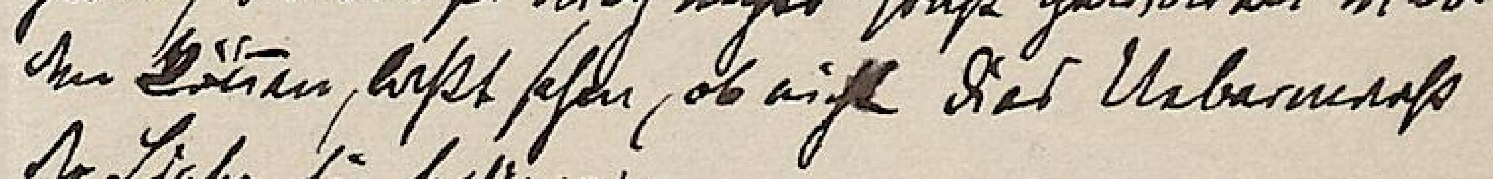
den könen, laßt sehen, ob nicht dies Uebermaaß
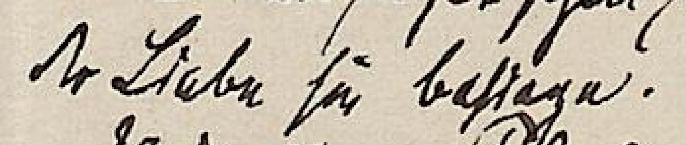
der Liebe sie besiegen.
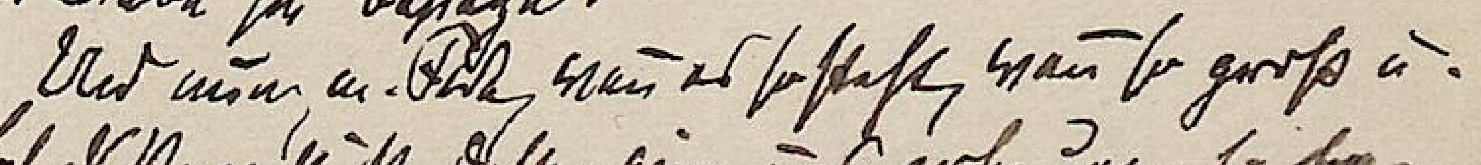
Und nun, m. Frde, wen es so steht, wen so groß u.
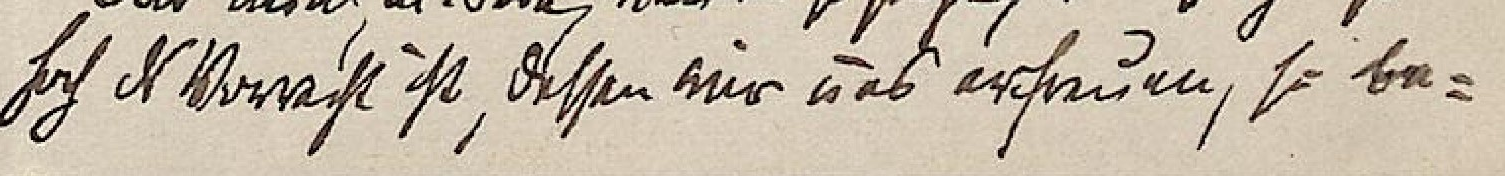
hoch ds Vorrecht ist, dessen wir uns erfreuen, so be¬
